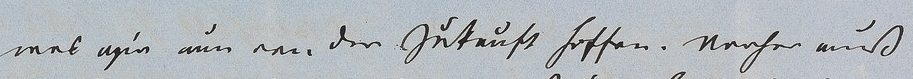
was wir nun von der Zukunft hoffen. Vorher muß
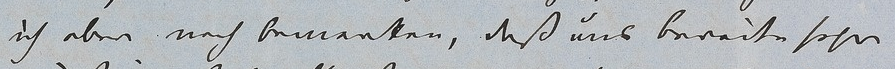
ich aber noch bemerken, daß uns bereits sehr
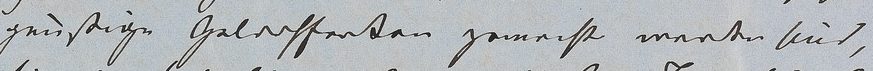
günstige Geldofferten gemacht worden sind,
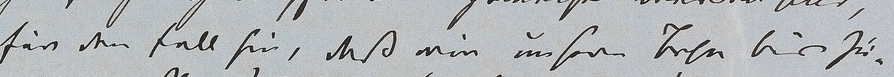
für den Fall hin, daß wir unsere Bahn bis Zü-
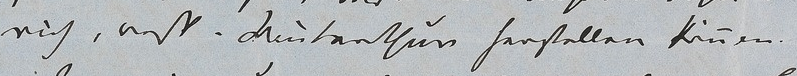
rich, evtl. Winterthur herstellen können.
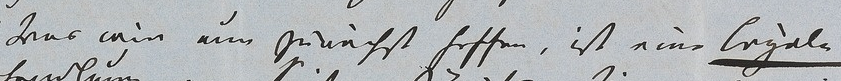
Was wir nun zunächst hoffen, ist eine loyale
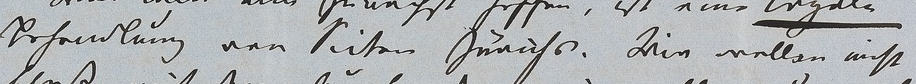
Behandlung von Seiten Zürichs. Wir wollen nicht
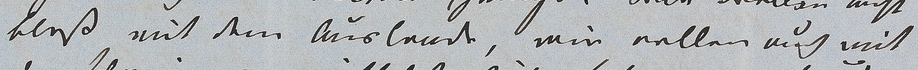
bloß mit dem Auslande, wir wollen auch mit
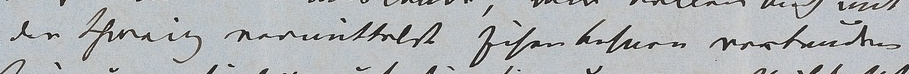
der Schweiz vermittelst Eisenbahnen verbunden
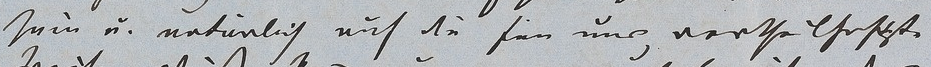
sein u. natürlich auf die für uns vortheilhafteste
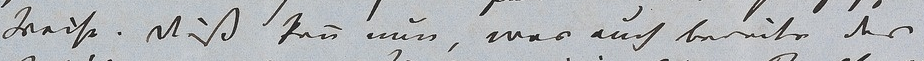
Weise. Dieß kann nun, was auch bereits das
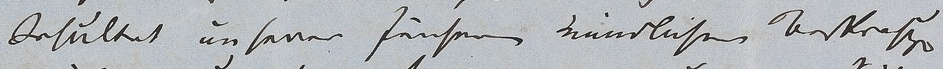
Resultat unserer frühern mündlichen Besprechungen
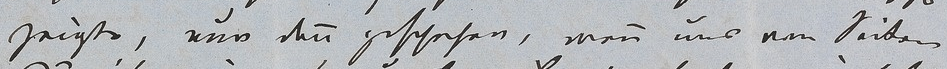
zeigte, nur dann geschehen, wenn uns von Seiten
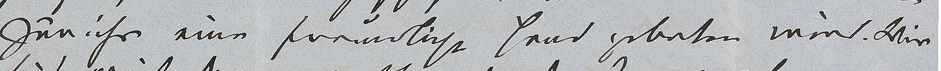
Zürichs eine freundliche Hand geboten wird. Wir
